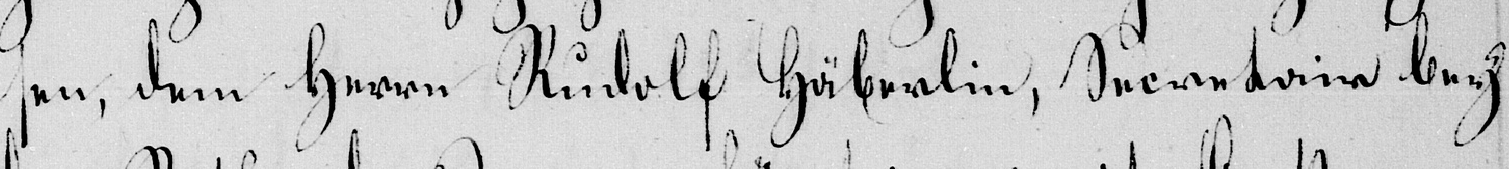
en, dem Herrn Rudolf Häberlin, Secretair bey
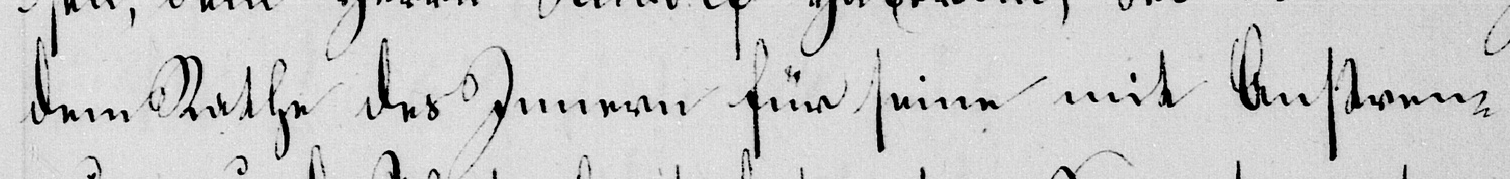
dem Rathe des Innern für seine mit Anstren¬
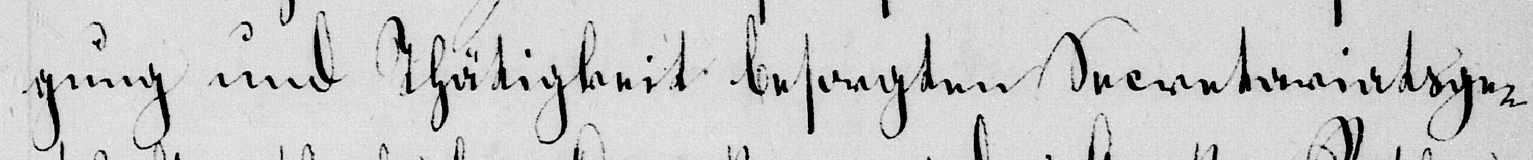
gung und Thätigkeit besorgten Secretariatsge¬
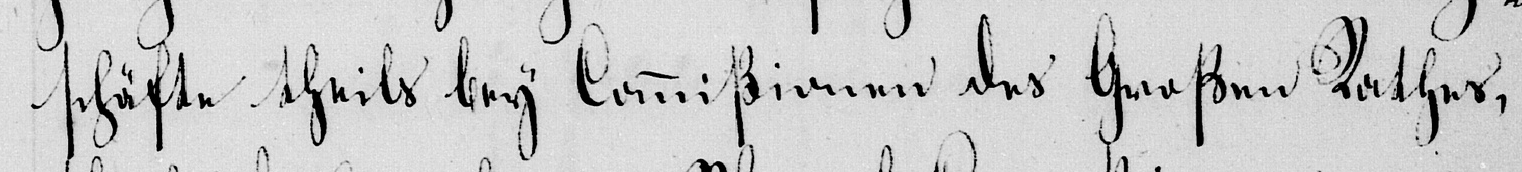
schäfte theils bey Commißionen des Großen Rathes,
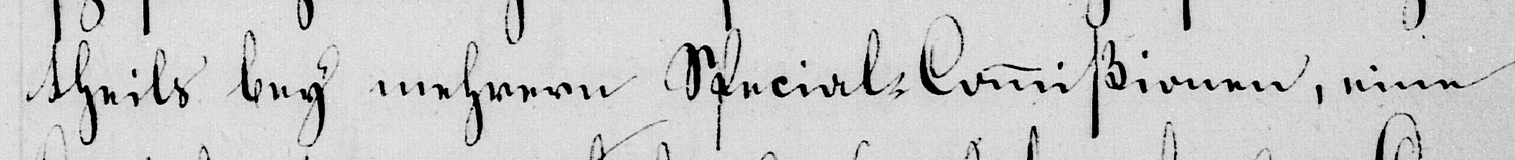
theils bey mehrern Special-Commißionen, eine
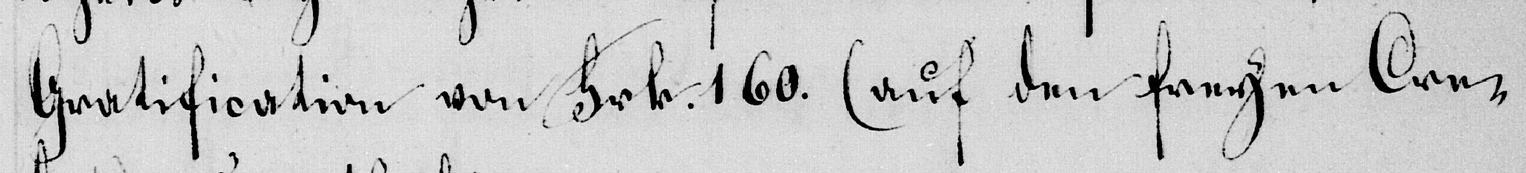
Gratification von Frk. 160. (auf den freyen Cre¬
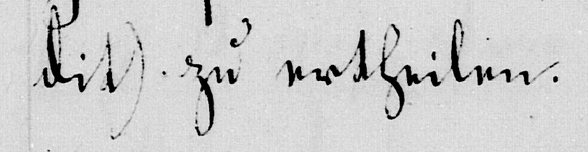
dit) zu ertheilen.
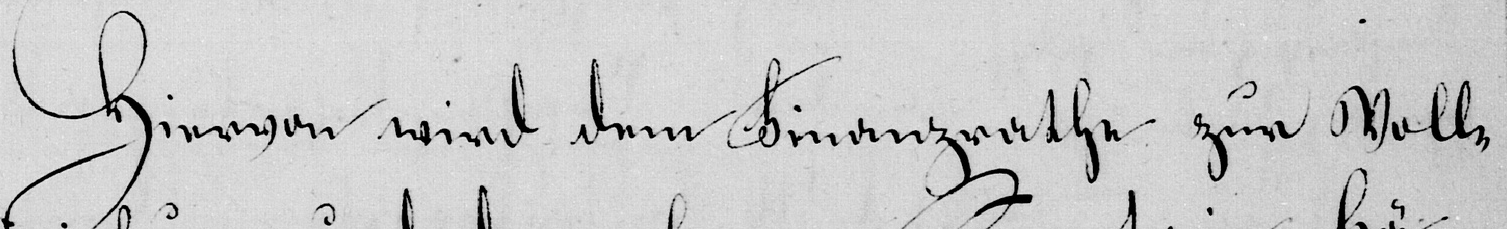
Hiervon wird dem Finanzrathe zur Voll¬
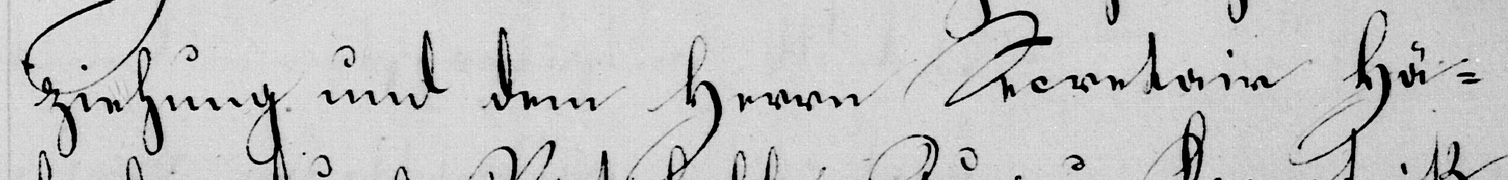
ziehung und dem Herrn Secretair Hä¬
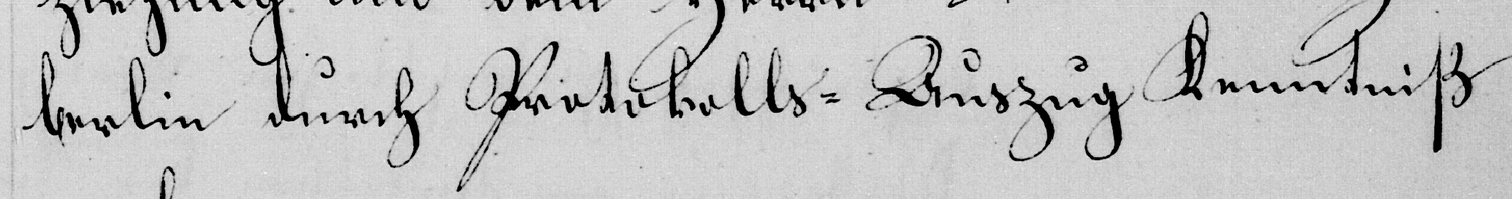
berlin durch Protokolls-Auszug Kenntniß
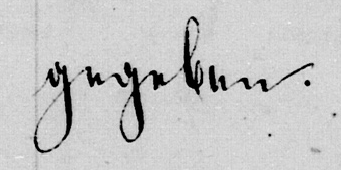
gegeben.
